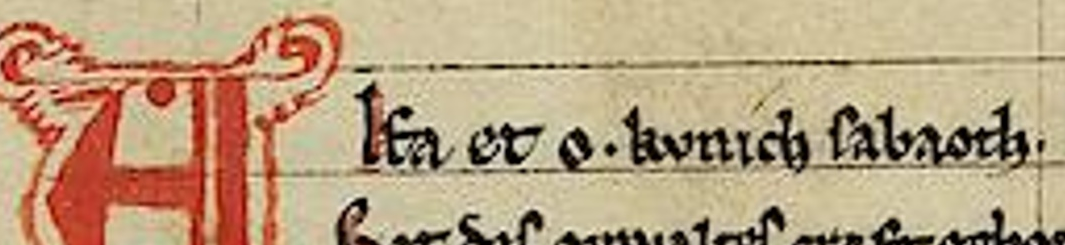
**Alfa et o. kvnich ſabaoth.
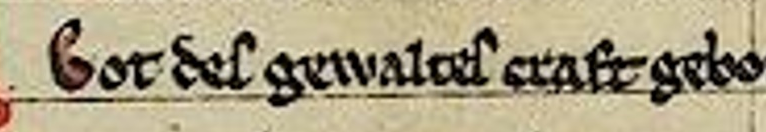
Got deſ gewalteſ craft gebot.
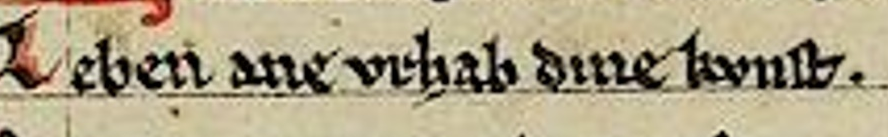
Leben ane vrhab dine kvnſt.
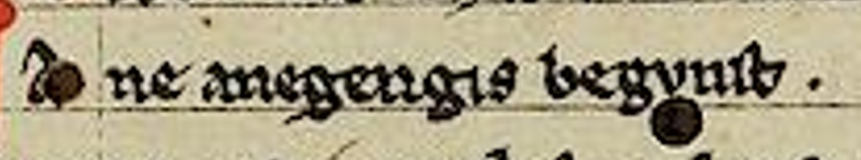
Ane anegengis begvnſt.
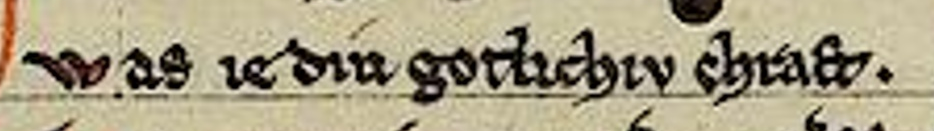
Was ie din gotlichiv chraft.
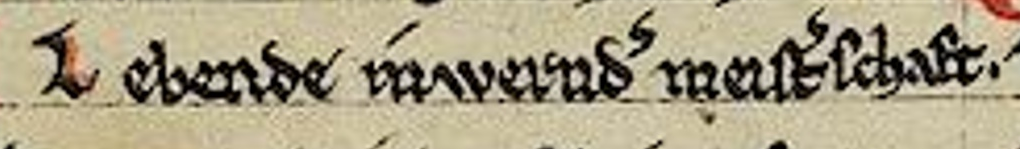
Lebende inwernd(er) meiſt(er)ſchaft.
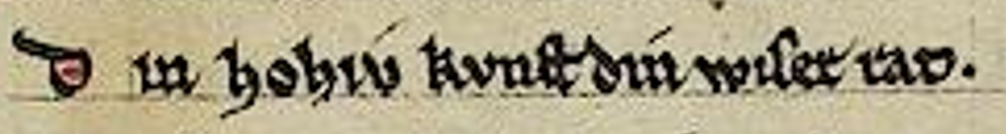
Din hohiv kvnſt din wiſer rat.
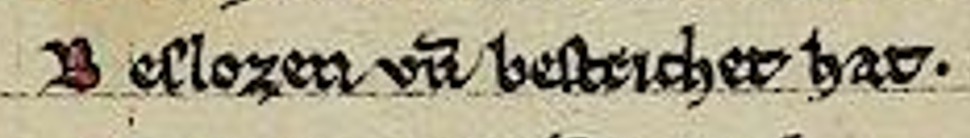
Beſlozen vn(d) beſtrichet hat.
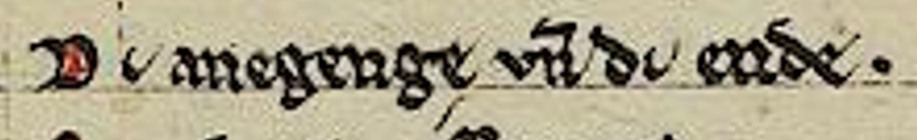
D(az) anegenge vn(d) d(az) ende.
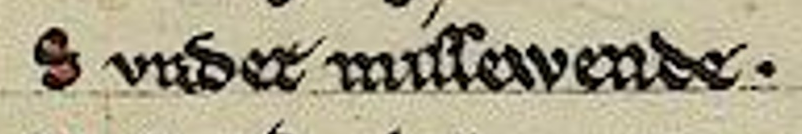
Svnder miſſewende.
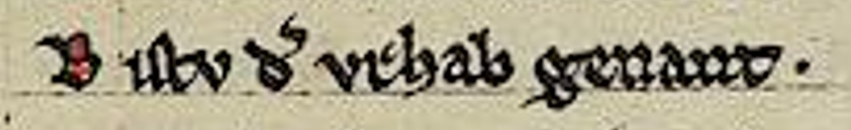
Biſtv d(er) vrhab genant.
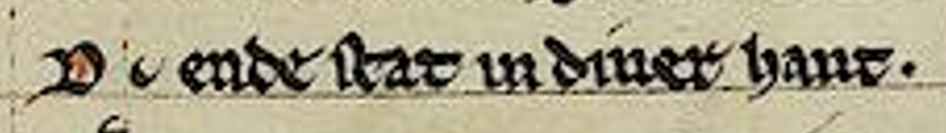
D(az) ende ſtat in diner hant.
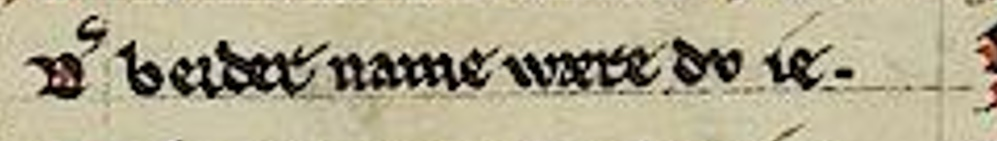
D(er) beider name w[ae]re dv ie.
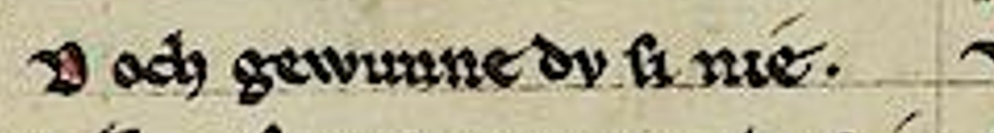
Doch gewunne dv ſi nie.
